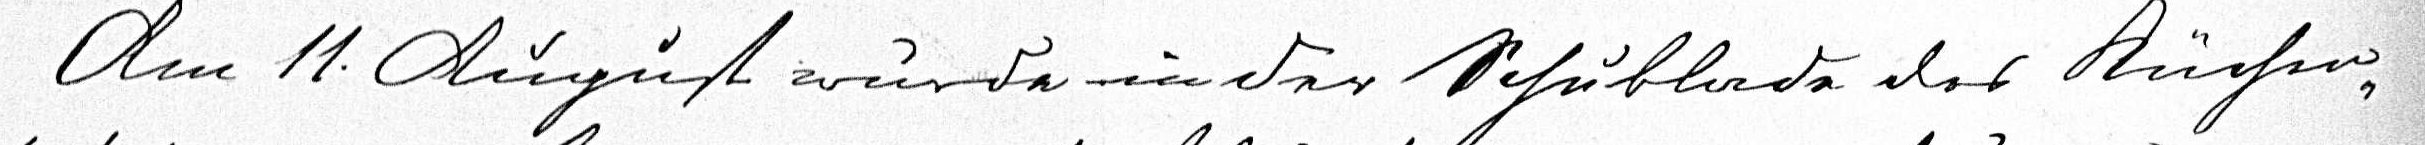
Am 11. August wurde in der Schublade des Küchen¬
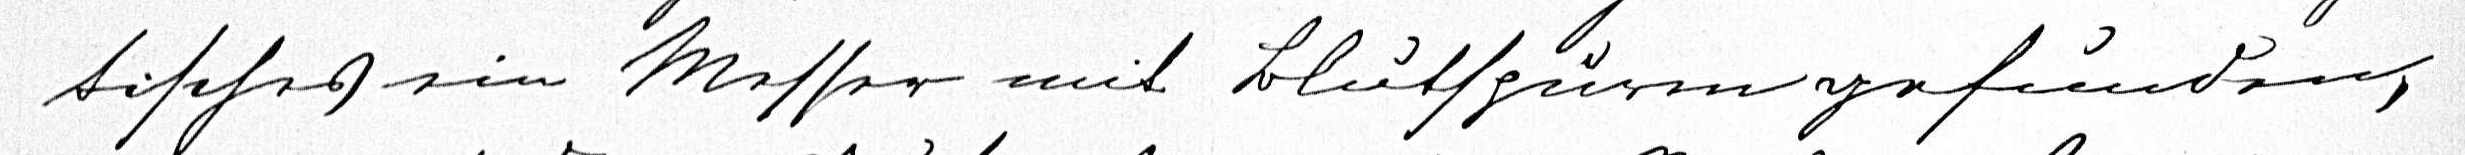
tisches ein Messer mit Blutspuren gefunden,
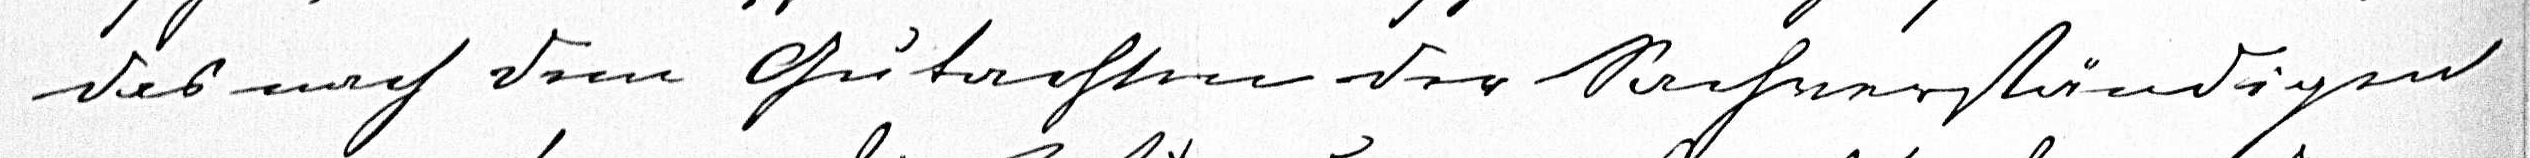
das nach dem Gutachten der Sachverständigen
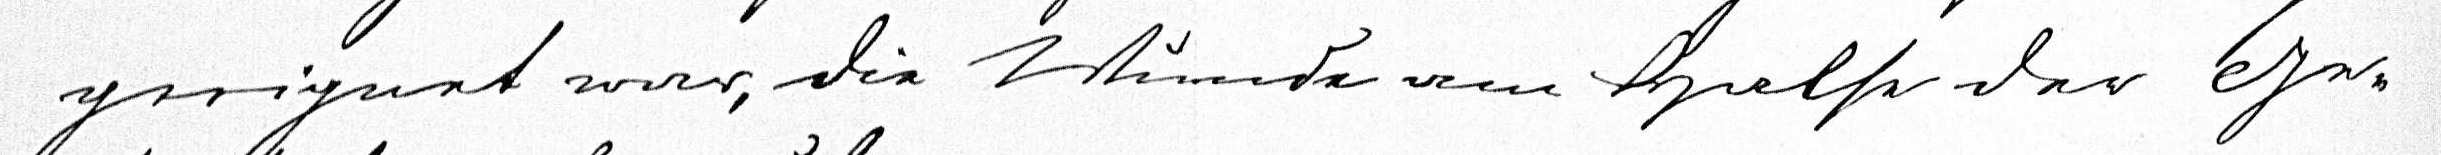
geeignet war, die Wunde am Halse der Ge¬
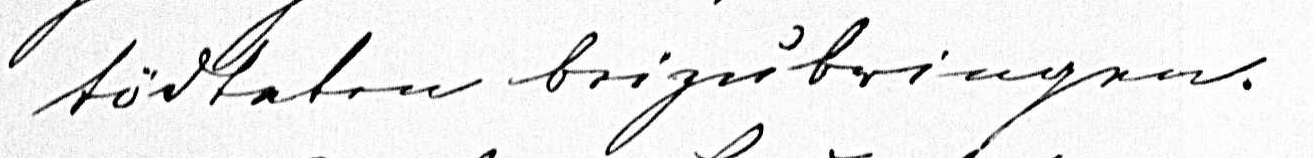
tödteten beizubringen.
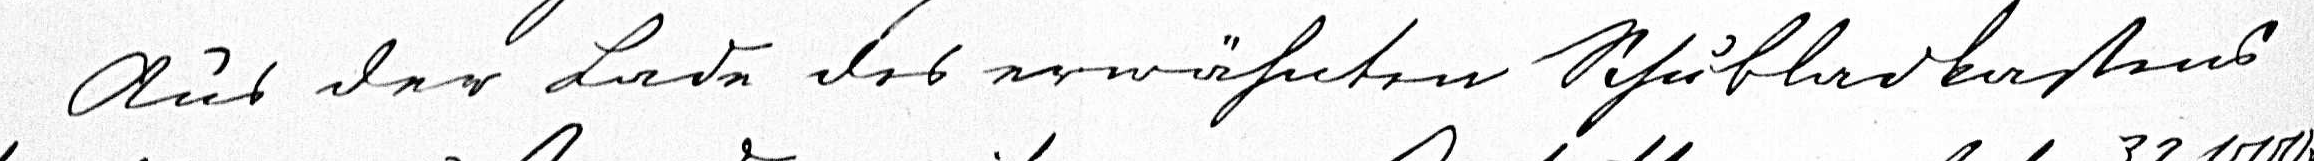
Aus der Lade des erwähnten Schubladkastens
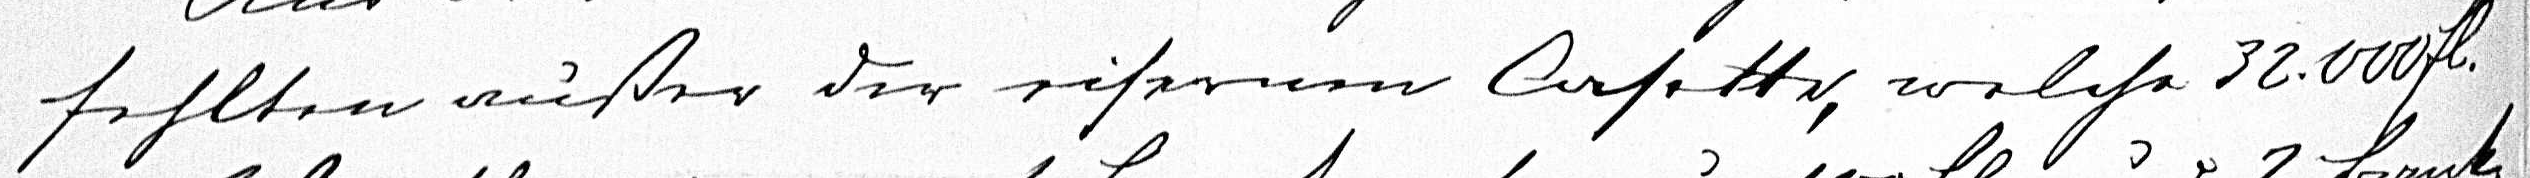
fehlten außer der eisernen Casette, welche 32,000 fl
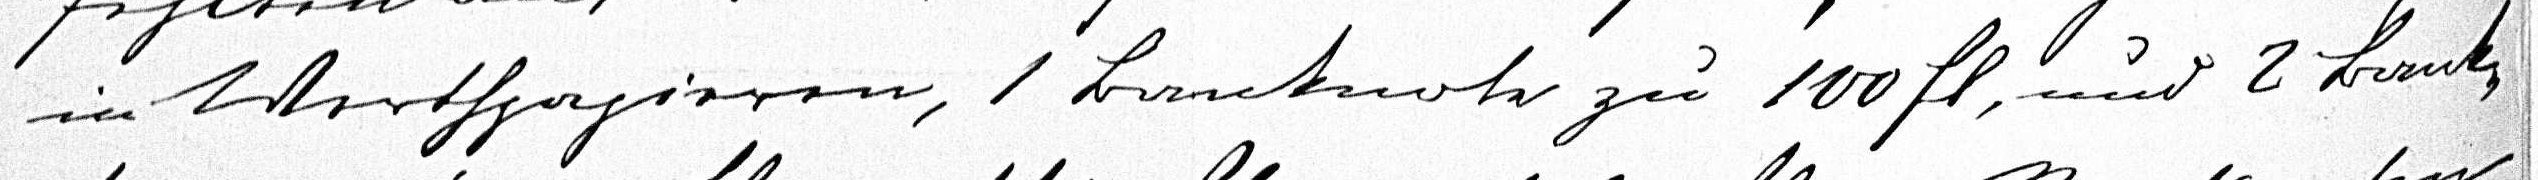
in Werthpapieren, 1 Banknote zu 100 fl und 2 Bank¬
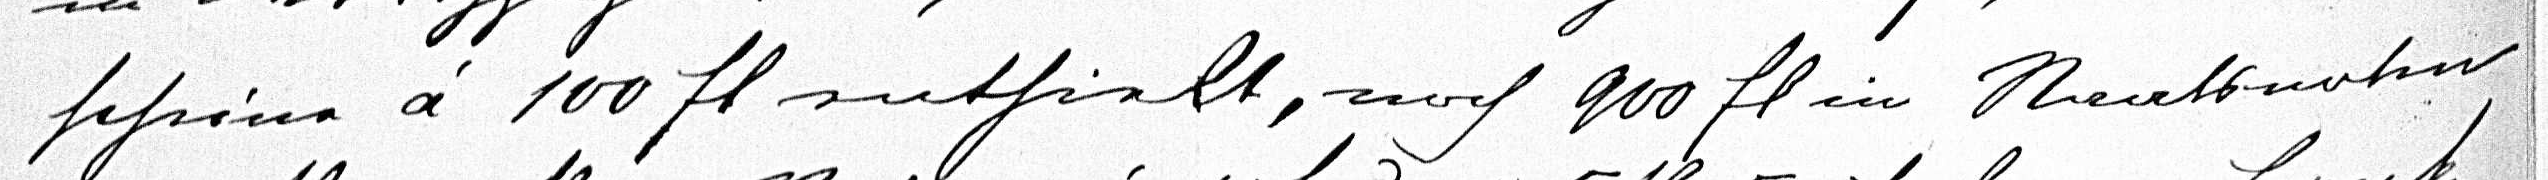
scheine à 100 fl enthielt, noch 900 fl in Staatsnoten
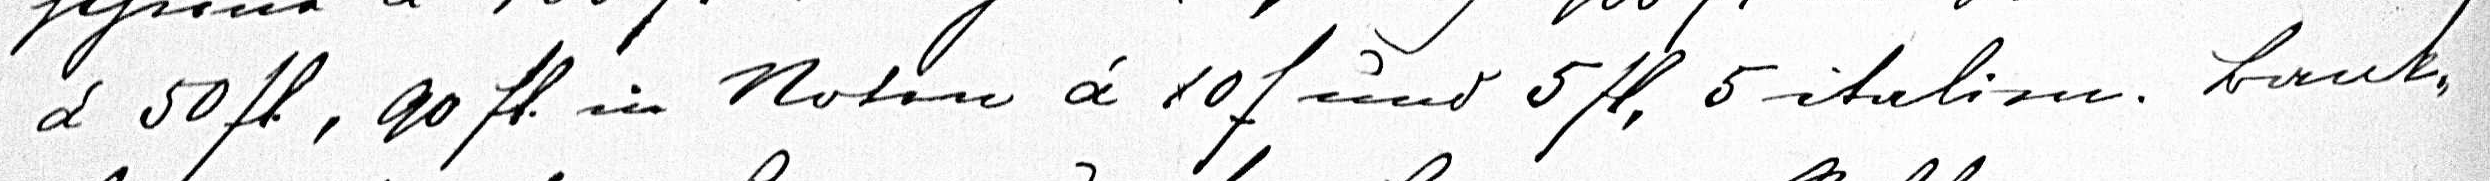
à 50 fl, 90 fl in Noten à 10 f und 5 fl, 5 italien. Bank¬
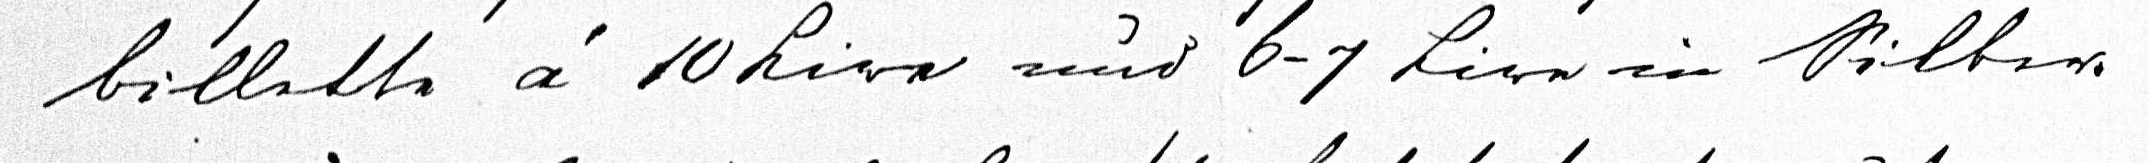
billette à 10 Lire und 6-7 Lire in Silber.
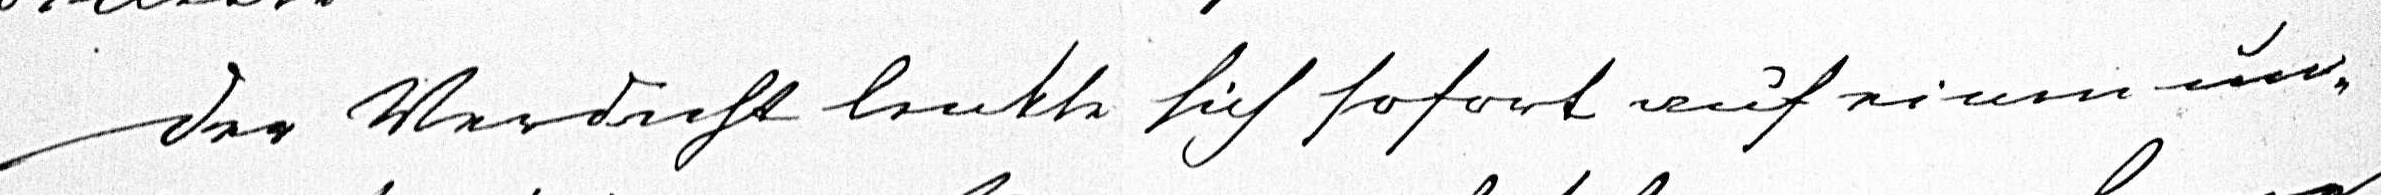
Der Verdacht lenkte sich sofort auf einen un¬
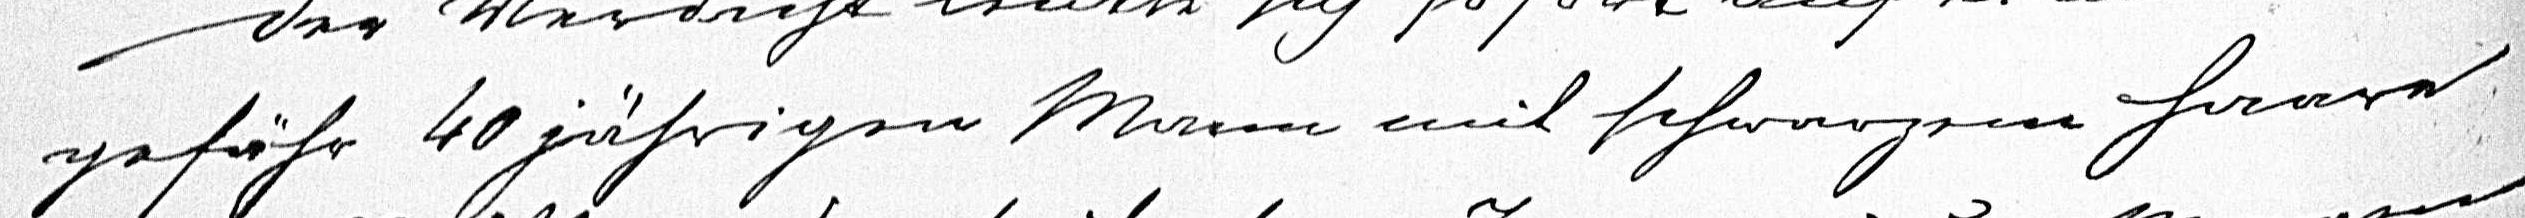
gefähr 40jährigen Mann mit schwarzen Haare
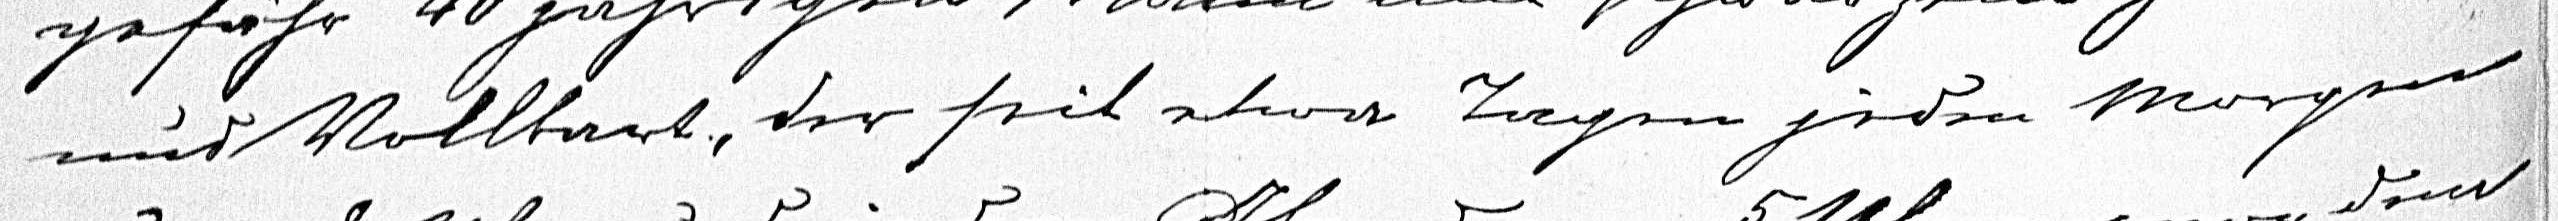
und Vollbart, der seit etwa Tagen jeden Morgen
